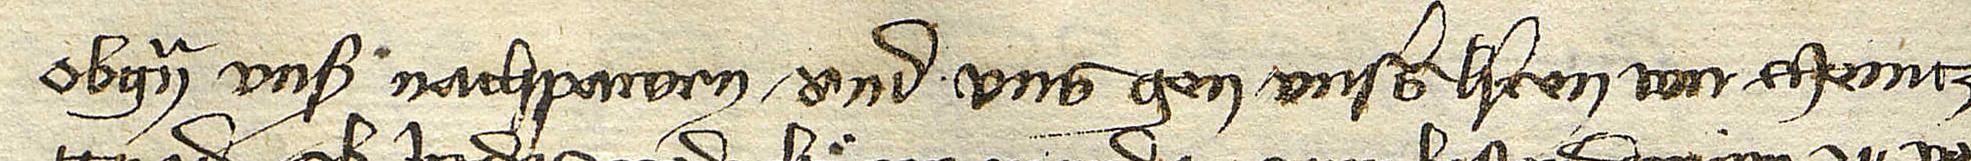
obgn* vnſ* nachpawrn / vnd vns gen vnſs* h*ren von Meincʒ
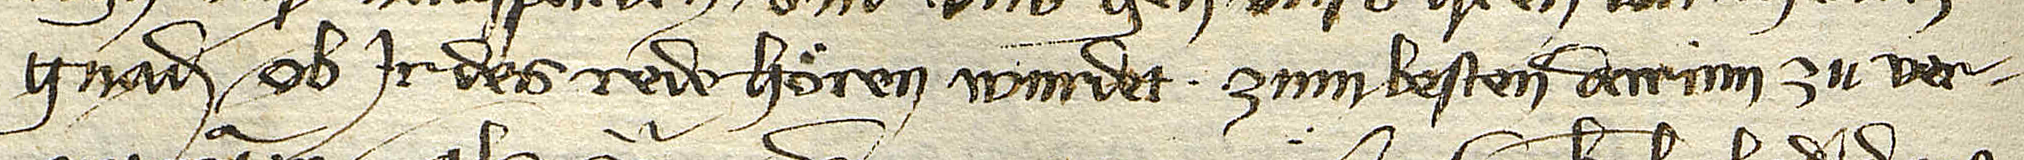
gnad* / ob Ir des rede hören wurdet . ʒum beſten darinn ʒu ver =
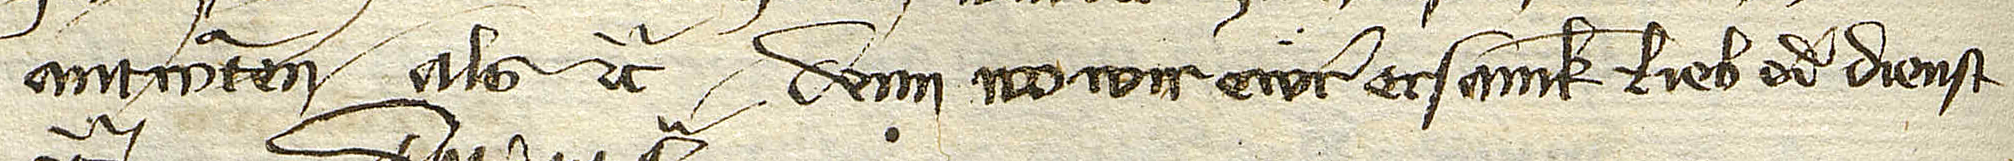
antw*ten / als ec* / Denn wo wir ewr* erſamk* Lieb od* dienſt
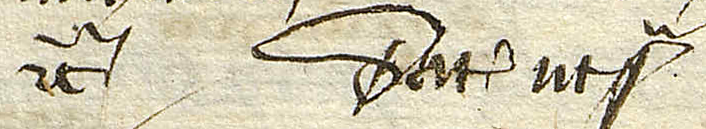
ec* / Dat* ut ſ*
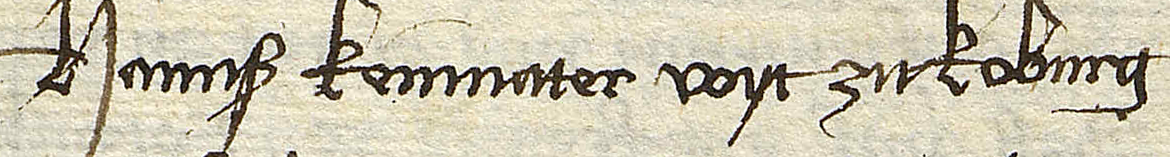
Hannſ* Kem*nater voyt ʒu Koburg
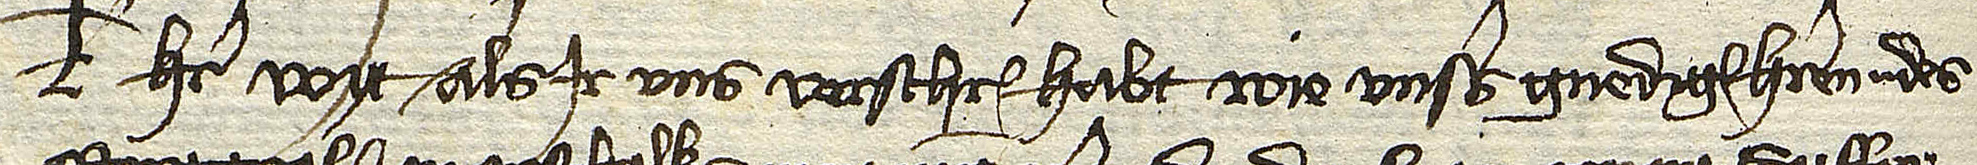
L* Hr* voyt / als Ir vns verſchr* habt wie vnſ*s gnedig* hr*en ~ des
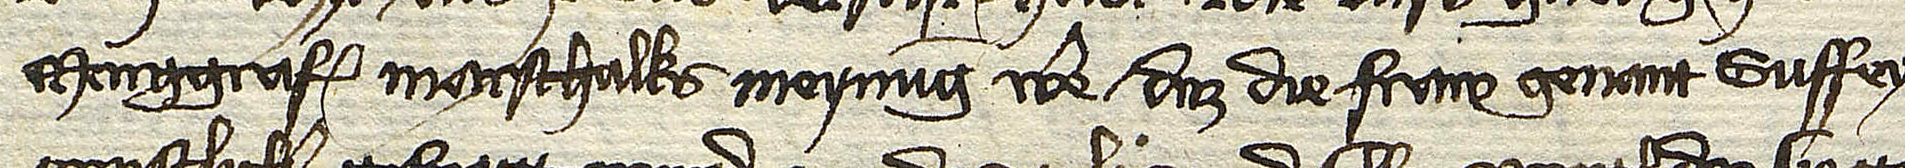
Marggraf* marſchalks meynug* we* / daʒ die fraw genant Suffey
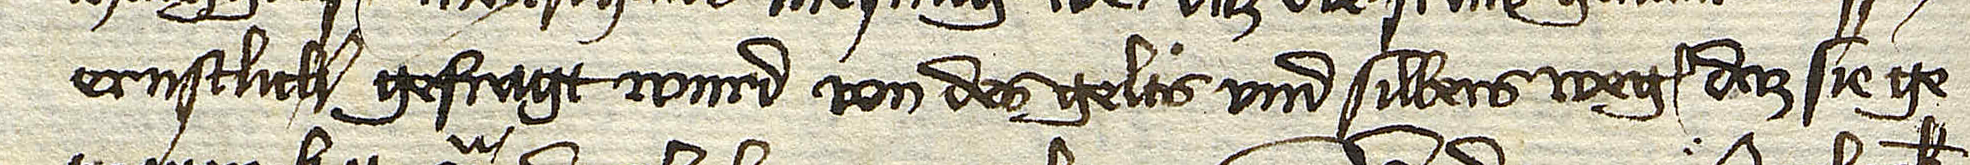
ernſtlich* gefragt wurd von des gelts vnd ſilbers weg* daʒ ſie ge =
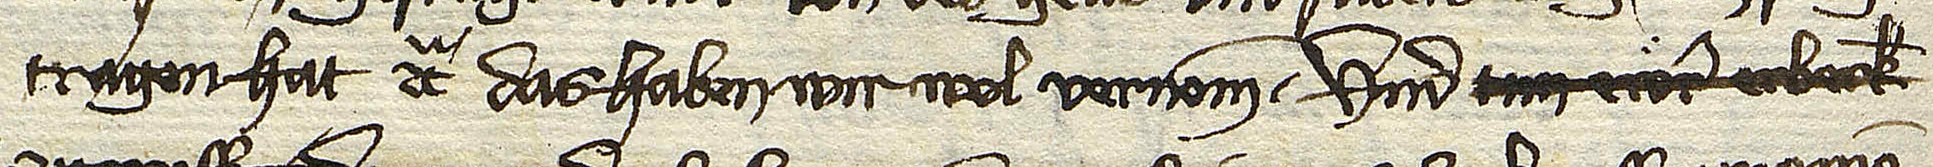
tragen hat ec* das haben wir wol vern*om / Vnd tun ewr* erberk*
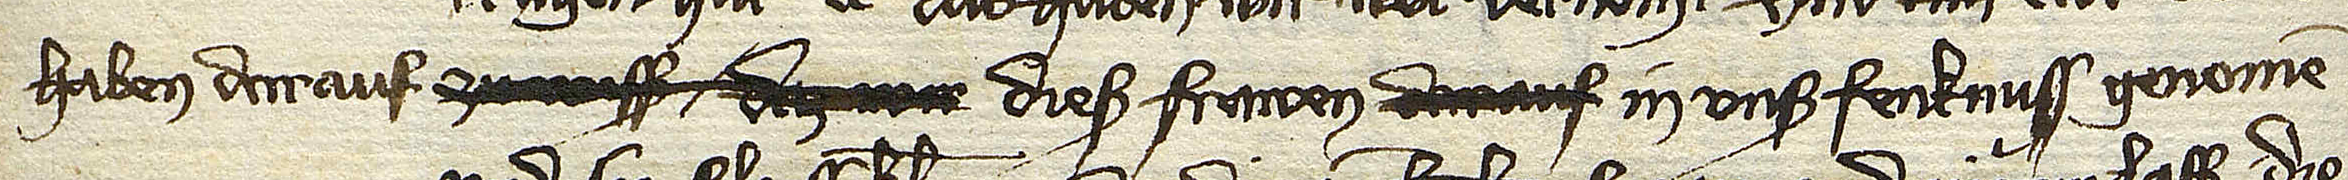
haben darauf ʒu wiſſ* / daʒ wir dieſ* frawen darauf in vnſ* fenknuſſ genome*
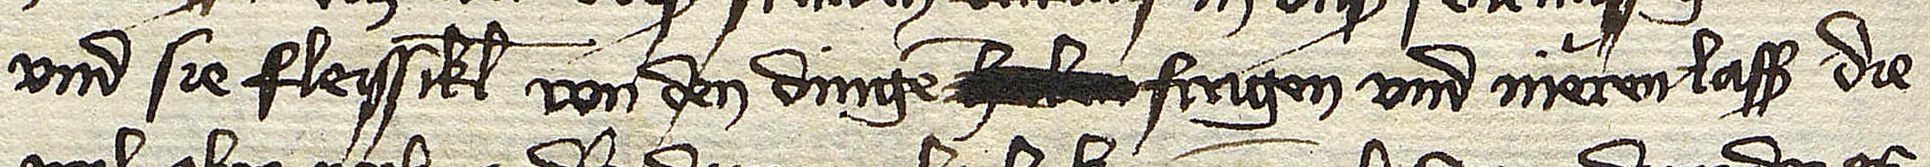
vnd ſie fleiſſikl* von den dinge* haben fragen vnd mëren laſſ* die
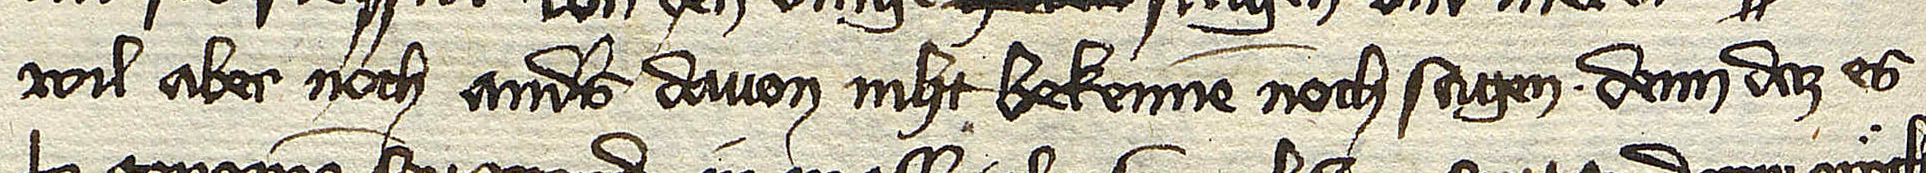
wil aber noch ands* dauon niht bekenne* noch ſagen . denn daʒ es
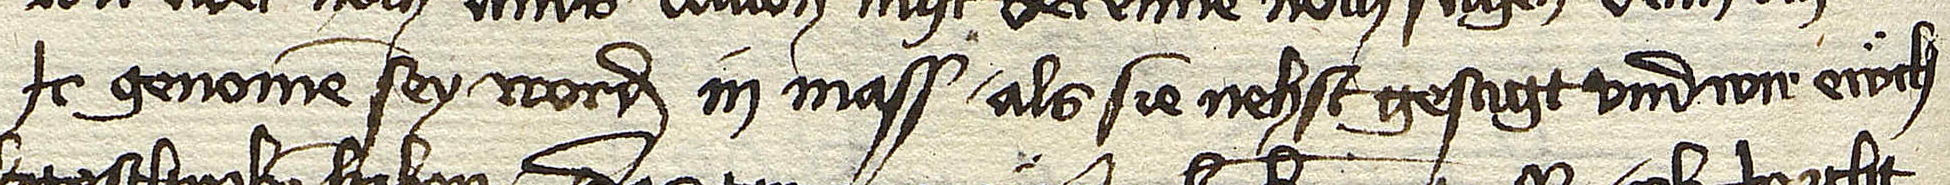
Ir genome* ſey word* in maſſ / als ſie nehſt geſagt vnd wir ewch
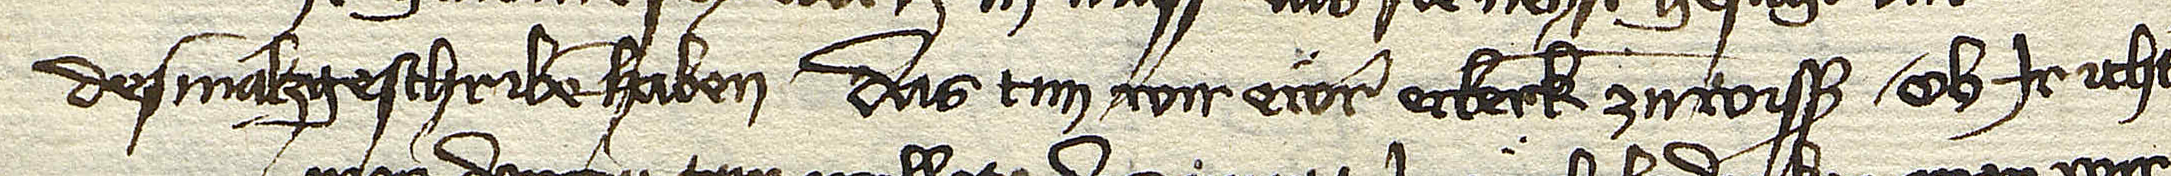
deſmalʒ geſchribe* haben Das tun wir ewr* erberk* ʒuwiſſ* / ob Ir icht
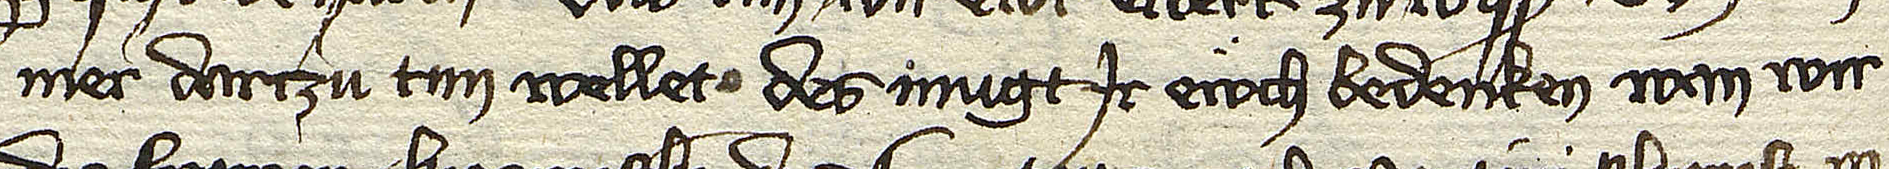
mer darcʒu tun wellet . das mugt Ir ewch bedenken wan wir
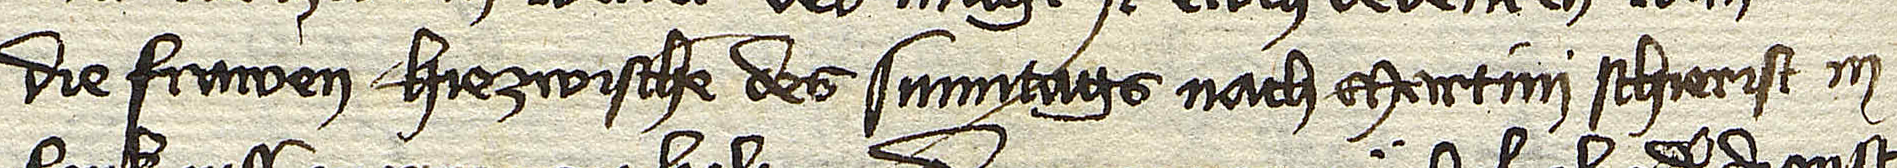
die frawen hieʒwische* des ſunntags nach Martini ſchieriſt in
